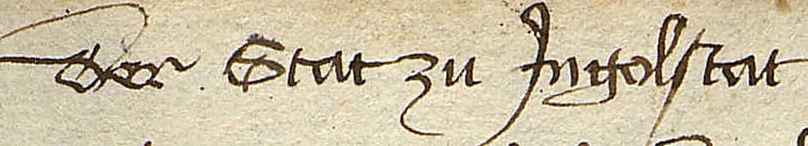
Der Stat ʒu Ingolſtat
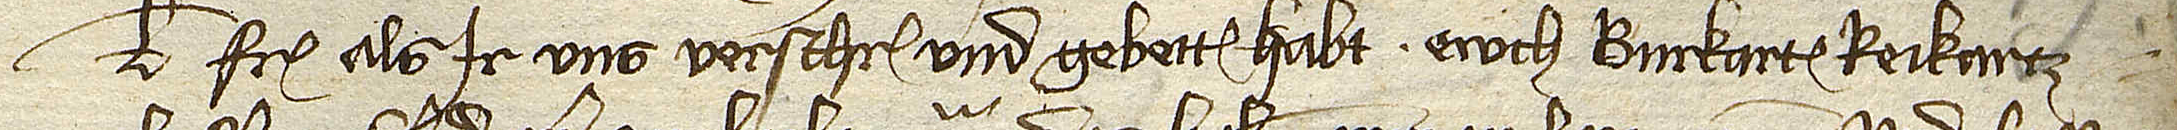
L* fr* als Ir vns verſchr* vnd gebett* habt . eẅch Burkart* Reikarcʒ =
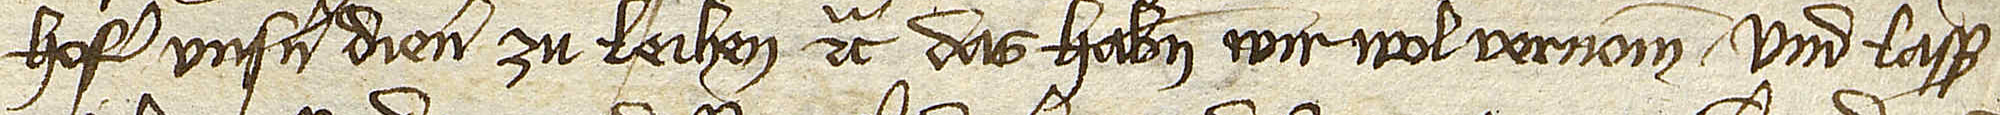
hof* vnſn* dien* ʒu leihen ec* das habn* wir wol vernom* / Vnd laſſ*
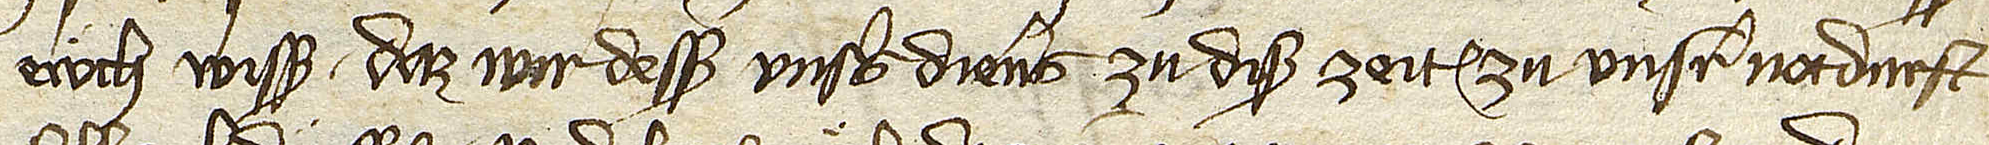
eẅch wiſſ* / daʒ wir deſſ* vnſ*s dien*s ʒu diſ* ʒeit* ʒu vnſr* notdurft
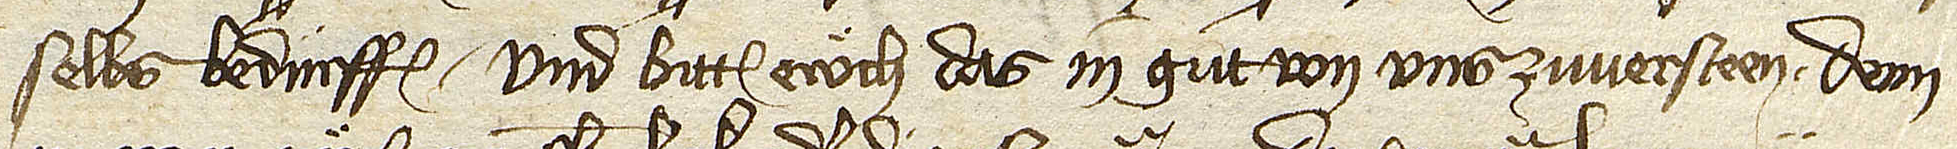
ſelbs bedürff* / Vnd bitt* eẅch das in gut von vns ʒuuerſteen / Denn
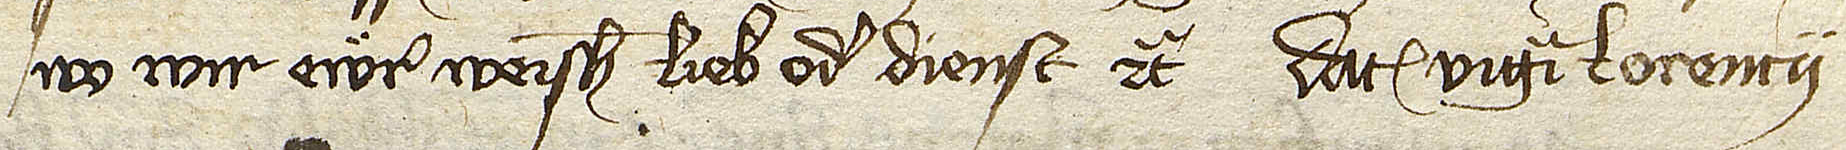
wo wir eẅr* weiſh* lieb od* dienſt ec* Dat* vigi* lorencii
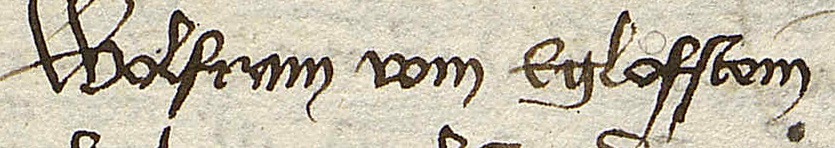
Wolfram vom Eglofſtein
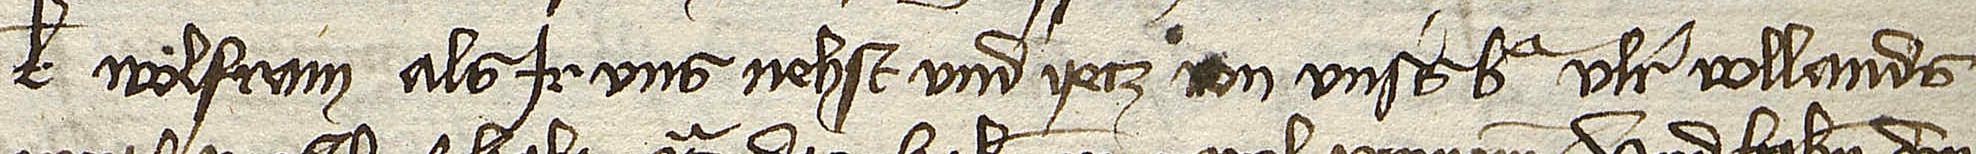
L* wolfram als Ir vns nehſt vnd yecʒ von vnſ*s b* vlr* vollands
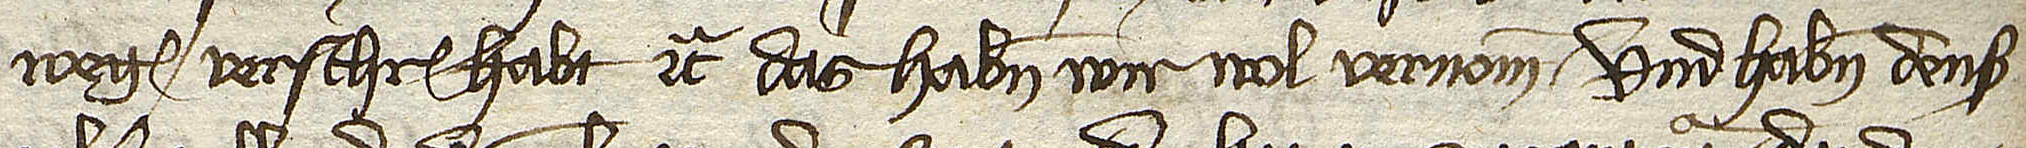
weg* verſchr* habt ec* das habn* wir wol vernom* / Vnd habn* denſ*
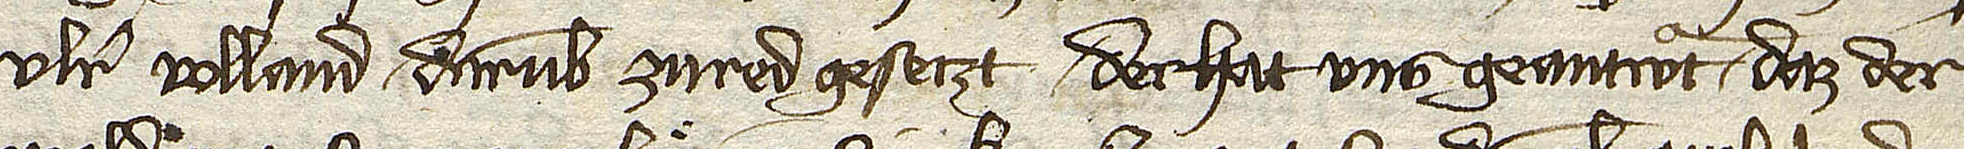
vlr* volland / Darub* ʒured geſecʒt / Der hat vns geantw*t / daʒ der
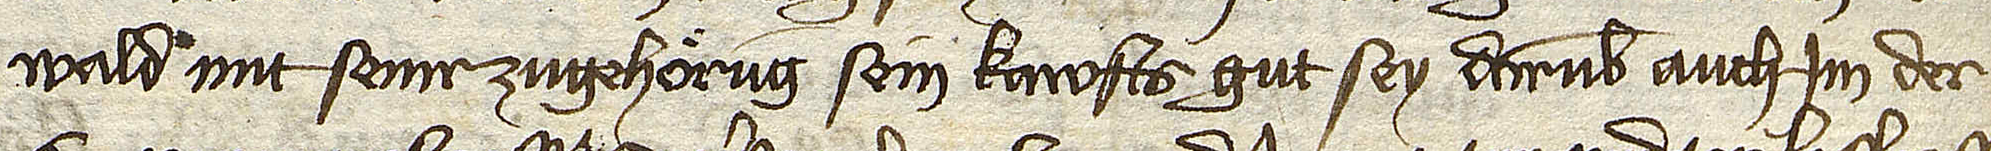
wald mit ſeinr ʒugehöru*g ſein kawfts gut ſey darub* auch Im der
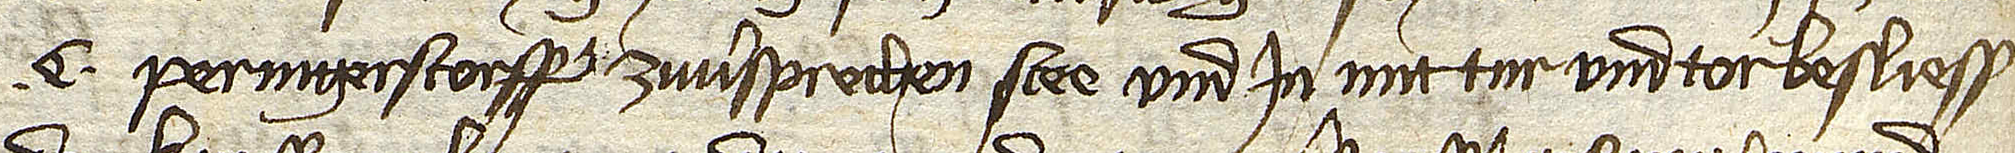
. C . Peringerſtorff* ʒuu*ſprechen ſtee vnd In mit tur vnd tor beſlieſſ
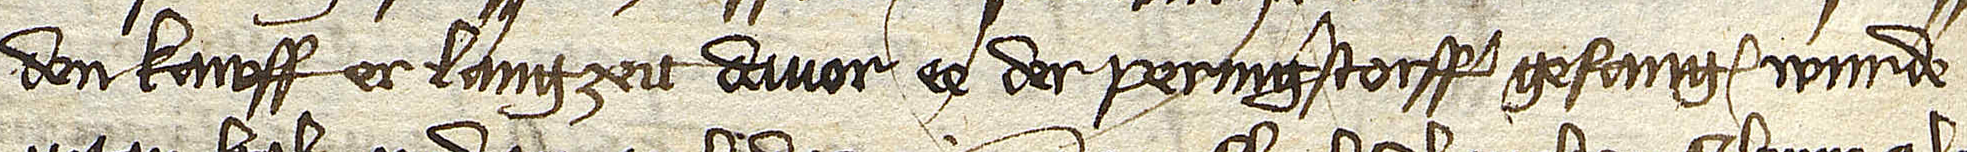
den kawff er langʒeit dauor ee der Pering*ſtorff* gefang* wurde
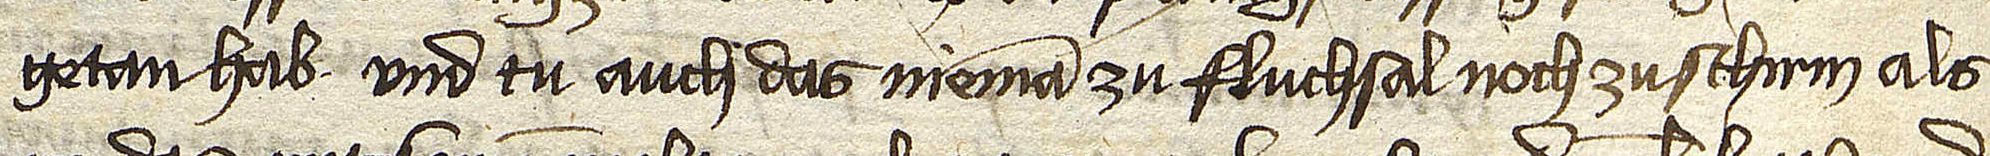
getan hab vnd tun auch das niema* ʒu fluchſal noch ʒu ſchirm als
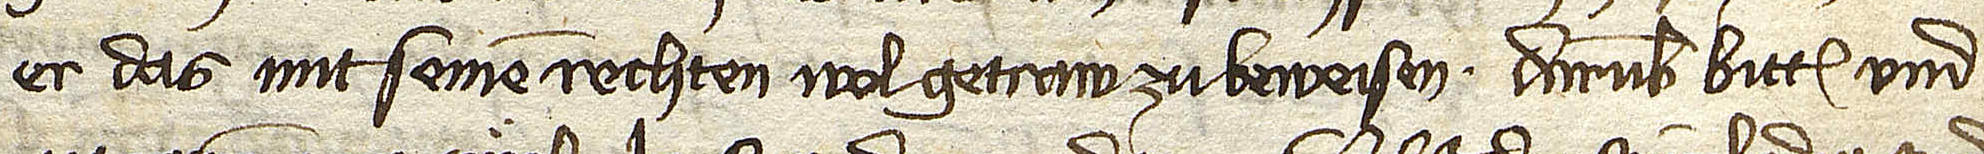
er das mit ſeine* rechten wol getraw ʒu beweiſen . Darub* bitt* vnd
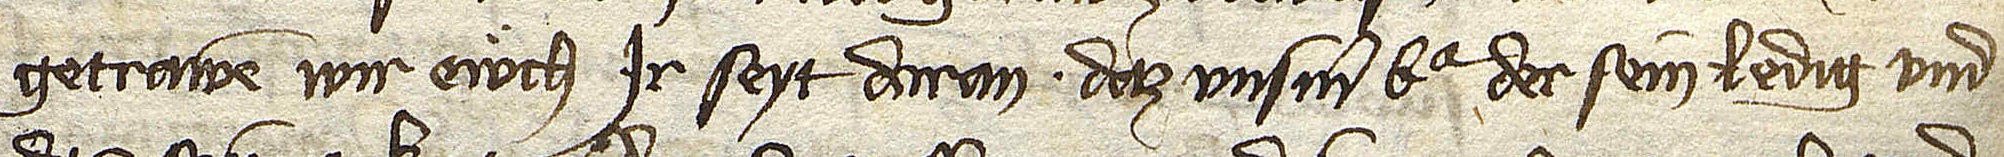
getrawe* wir eẅch Ir ſeyt daran . daʒ vnſm* b* der ſein ledig vnd
